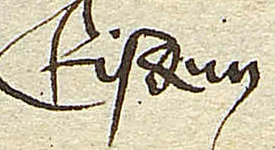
Eiſdem
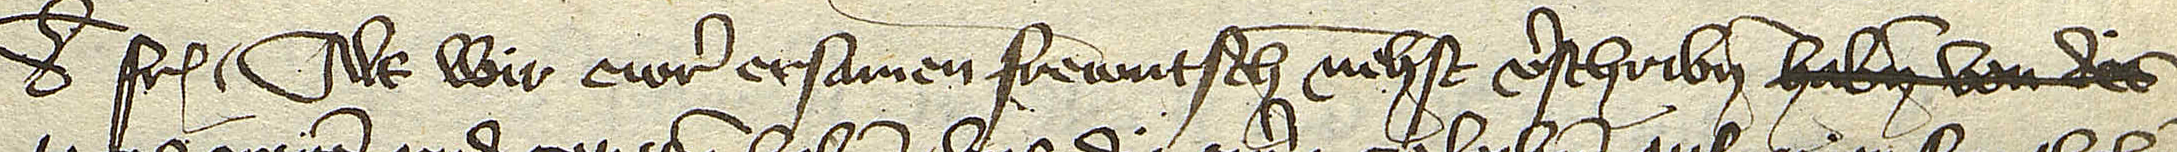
L* fr* / Als wir ewr* erſamen frewntſch* nehſt v*ſchribn* habn* von des
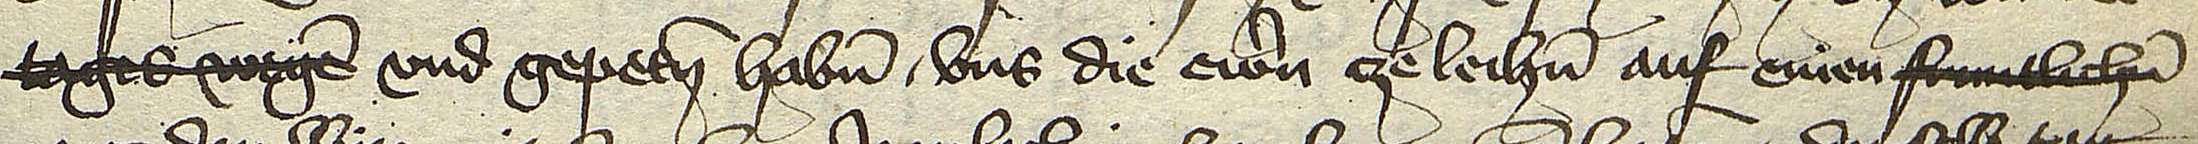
tages wege* vnd gepetn* habn* / vns die ew*n cʒe leihn* auf einen fruntlichn*
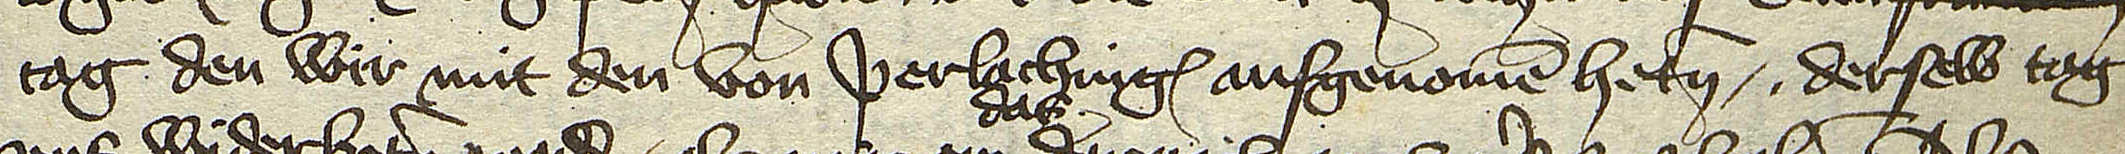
tag den wir mit den von Perlaching* aufgenome hetn* / . derſelb tag
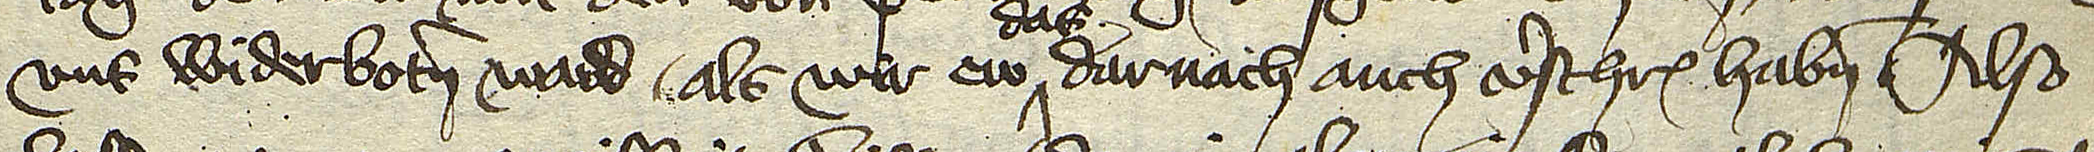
vns widerbotn* ward / als wir ew darnach auch v*ſchr* habn* / Alſo
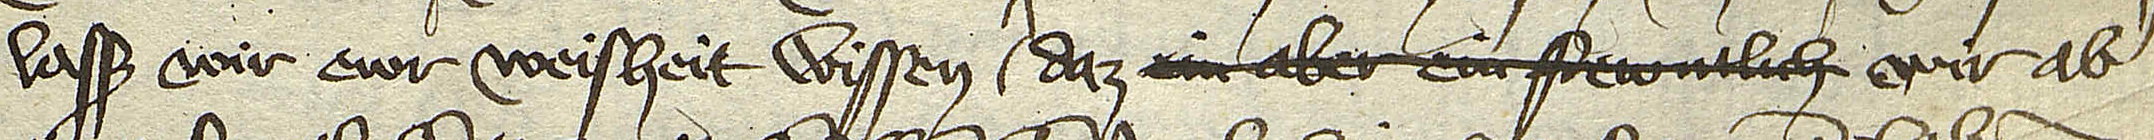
laſſ* wir ewr weiſheit wiſſen / daʒ ein aber ein frewntlich wir ab*
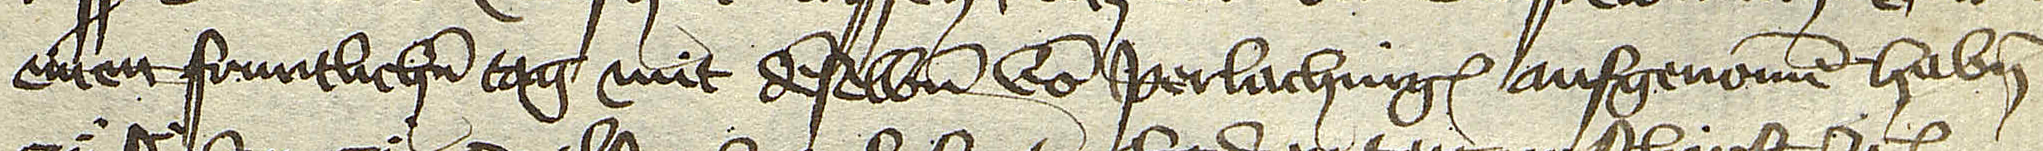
einen fruntlichn* tag / mit de*ſelbn* vo* Perlaching* aufgenome* habn*
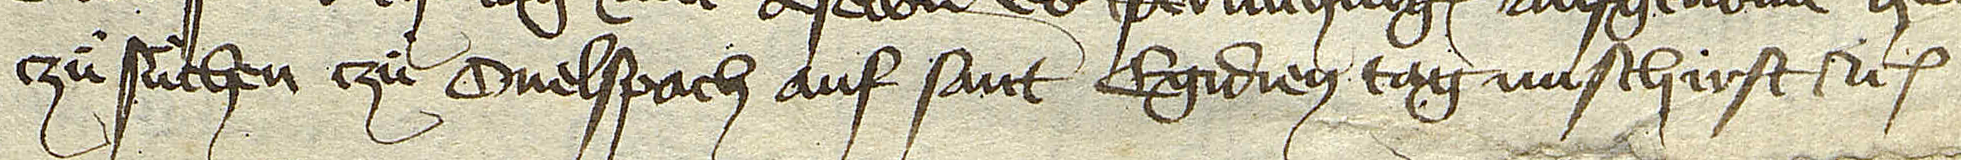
cʒü ſüchen cʒü Onelſpach auf ſant Egidien tag nu ſchirſt ec*
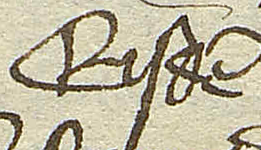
Eiſde*
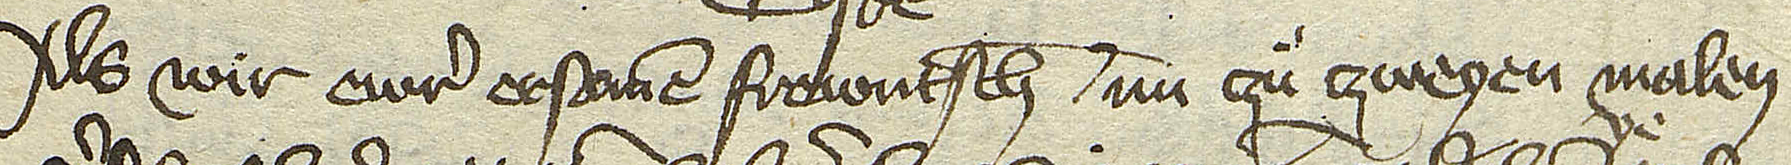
Als wir ewr* erſame* frewntſch* / nu cʒü cʒweyen malen
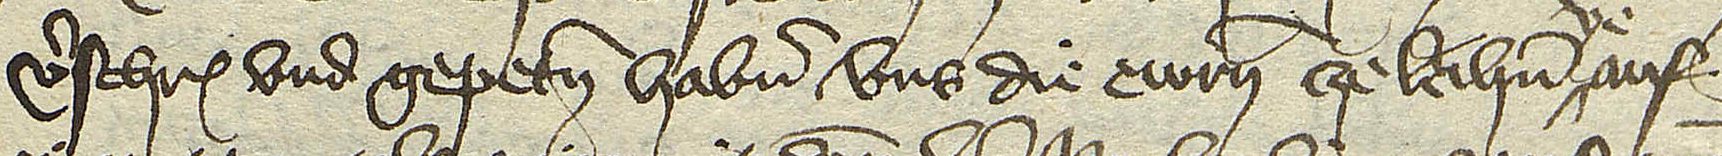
v*ſchr* vnd gepetn* habn* / vns die ewrn* cʒe leihn* auf
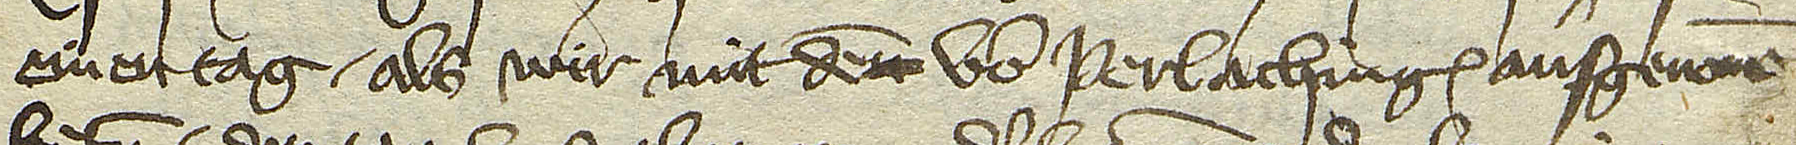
einen tag / als wir mit den* vo* Perlaching* aufgenome*
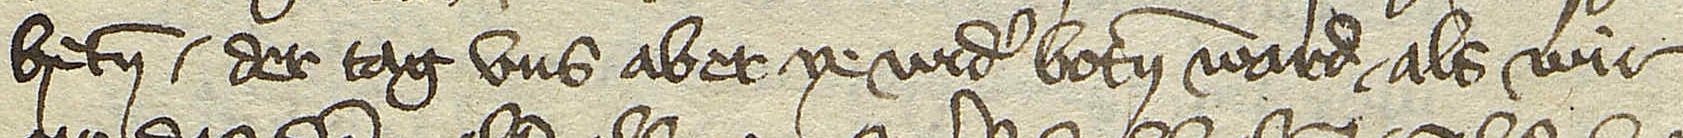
hetn* / der tag vns aber ye vnd botn* ward / als wir
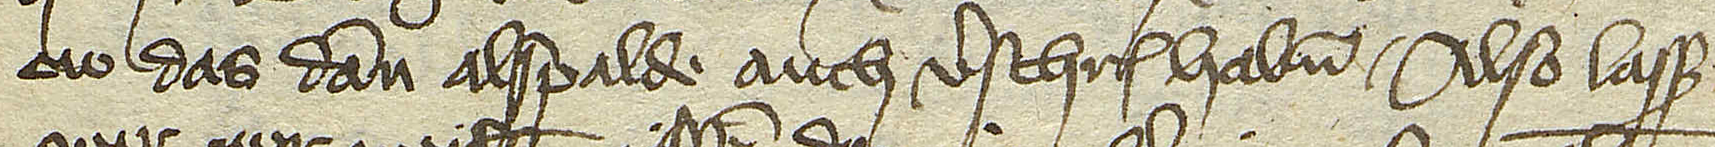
ew das dan* alſpalde auch v*ſchr* habn* / Alſo laſſ*
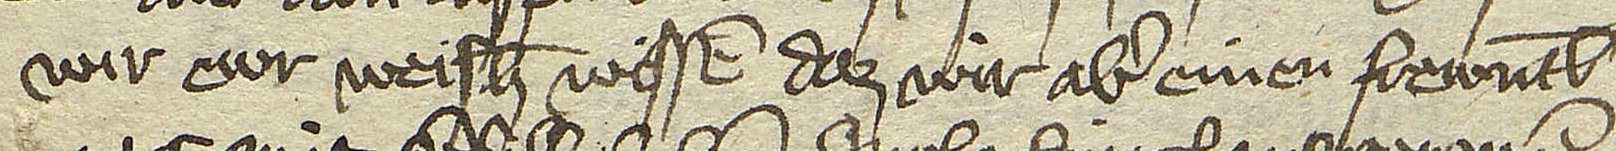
wir ewr weiſh* wiſſe* daʒ wir ab* einen frewntl*
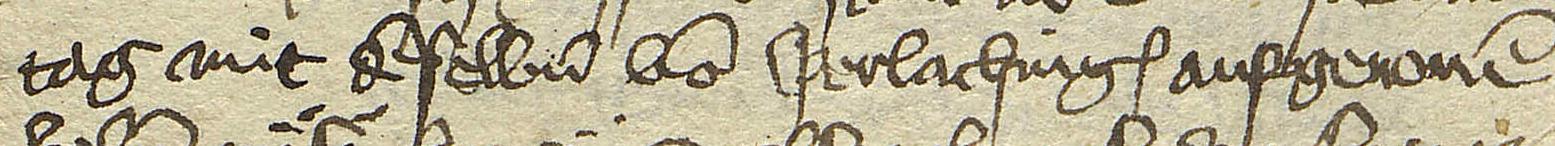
tag mit de*ſelbn* vo* Perlaching* aufgenome*
